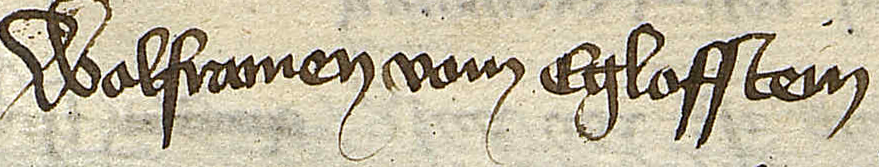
Wolframen vom Egloffſtein
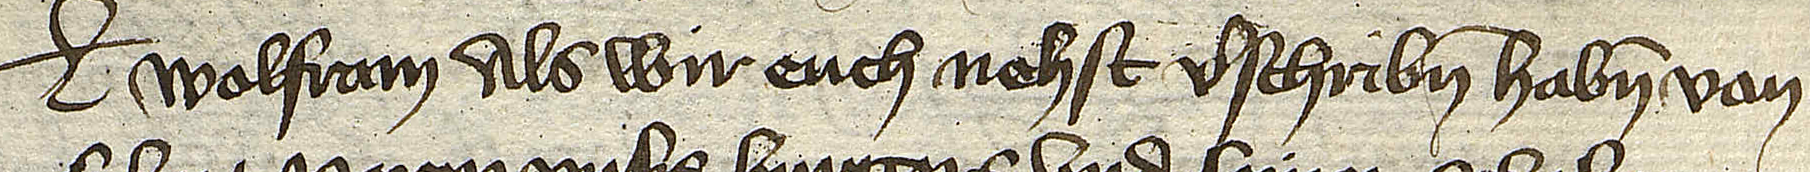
L* wolfram Als wir euch nehſt verſchribn* habn* von
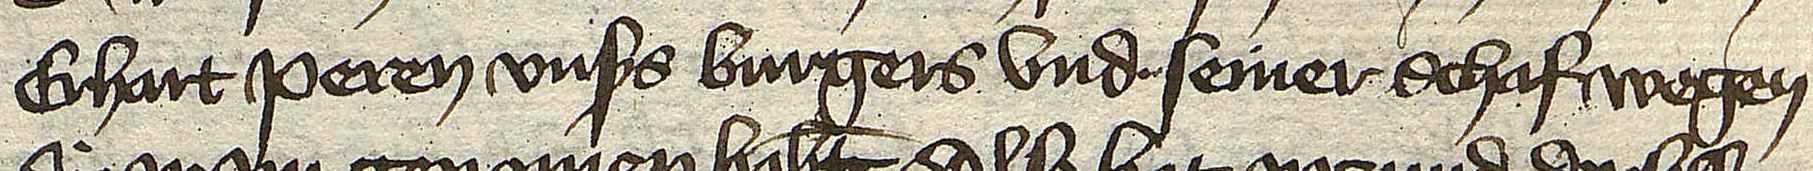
Erhart Peren vnſ*s burgers vnd ~ ſeiner Schaf wegen
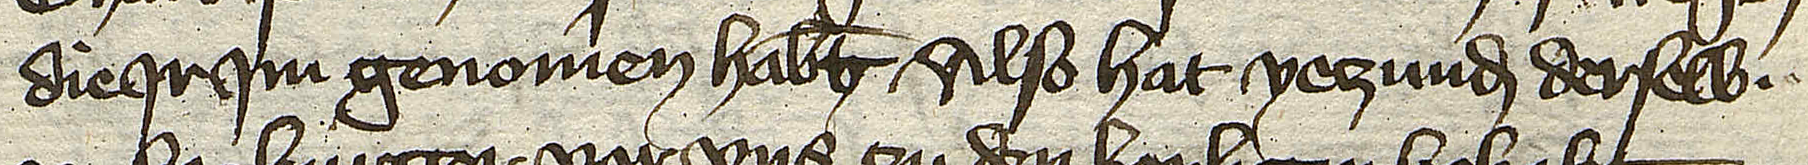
die Ir Im genomen habt* / Alſo hat yecʒund derſelb ~
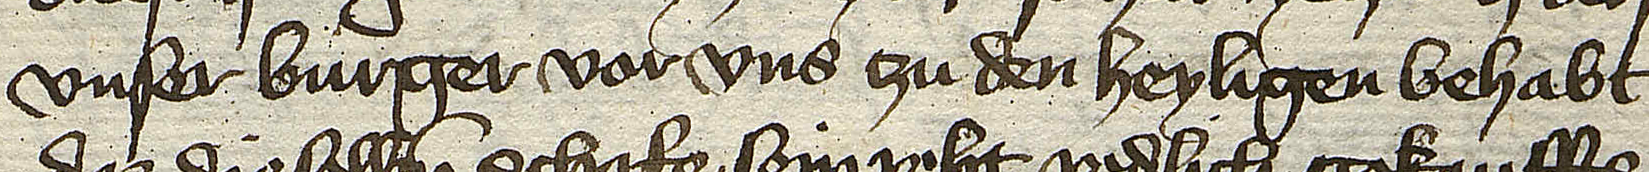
vnſer burger vor vns cʒu den heyligen behabt
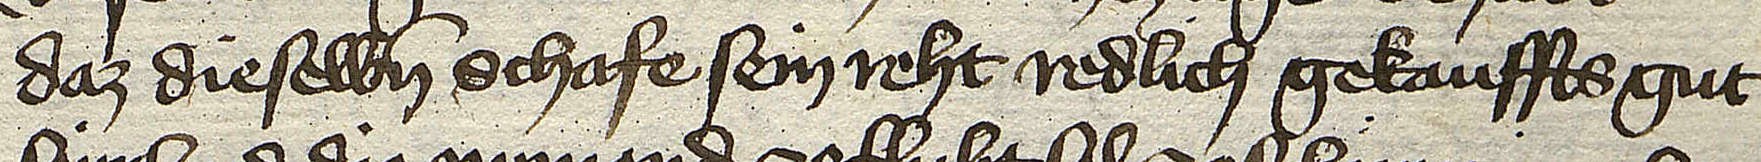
daʒ dieſelbn* Schafe ſein reht redlich gekauffts gut
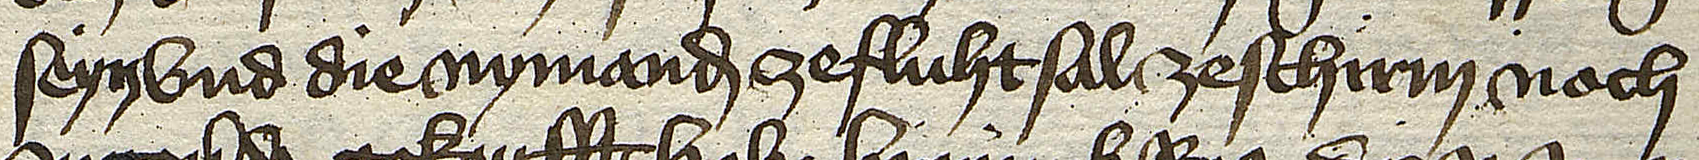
ſeyn vnd die nymand* cʒefluht ſal cʒeſchirm noch
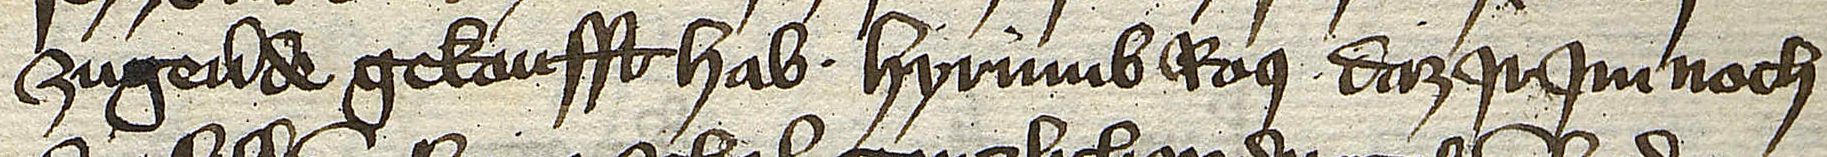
cʒugeu*de gekaufft hab . hyrümb Ro* Daʒ Ir Im noch
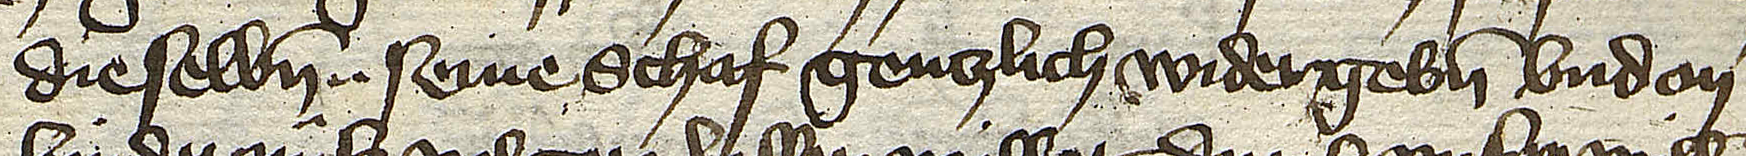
dieſelbn* ~ ſeine Schaf gencʒlich widergebn* vnd on
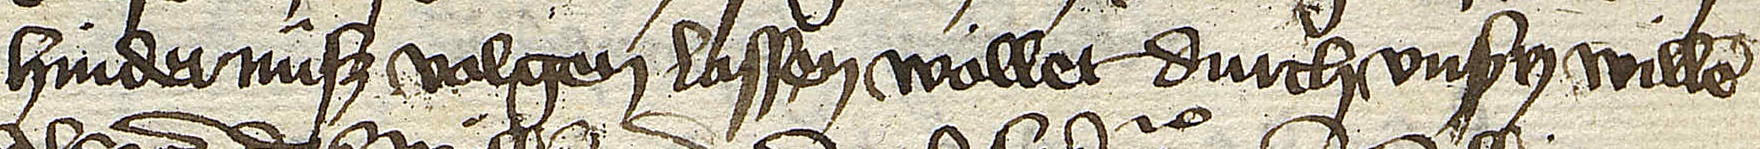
hindernüſʒ volgen laſſen wöllet durch vnſ*n wille*
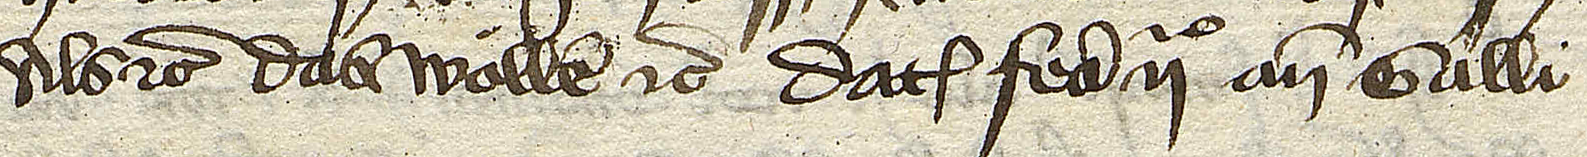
Als ec* Das wölle* ec* Dat* fea* ii* an* Galli
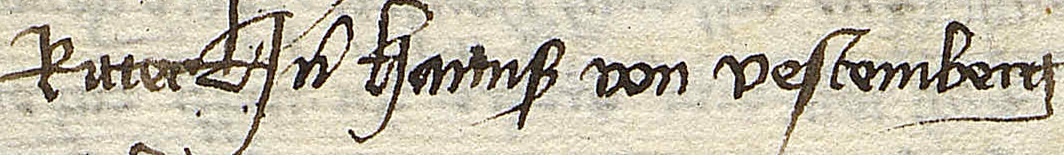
Ritter Hn* Hannſ* von veſtemberg
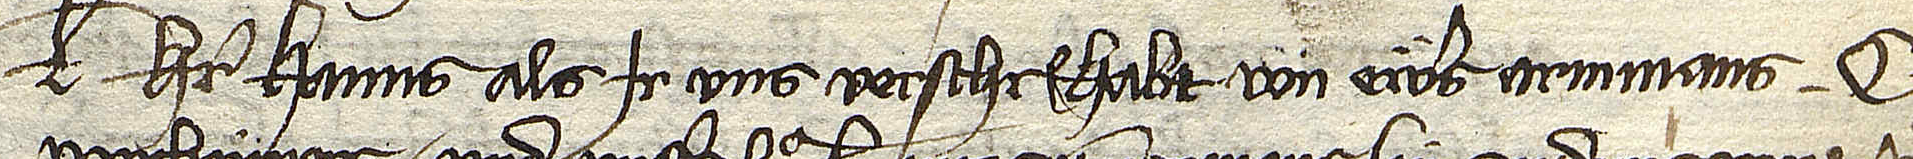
L* hr* Hanns als Ir vns verſchr* habt von eẅ*s armmans . C .
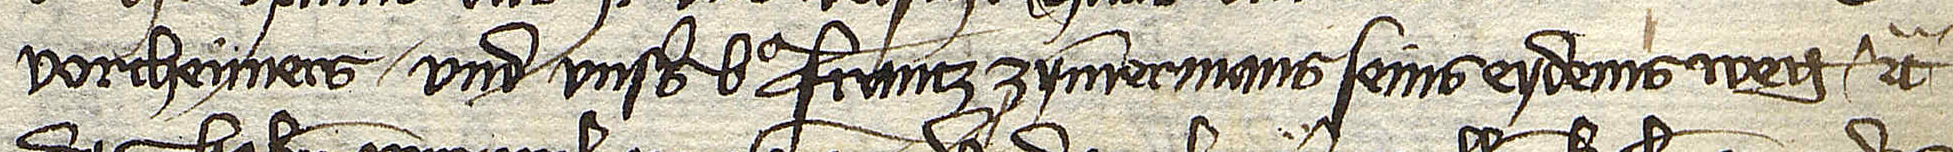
vorcheimers / vnd vnſ*s b* francʒ ʒym*ermans ſeins eydems weg* ec*
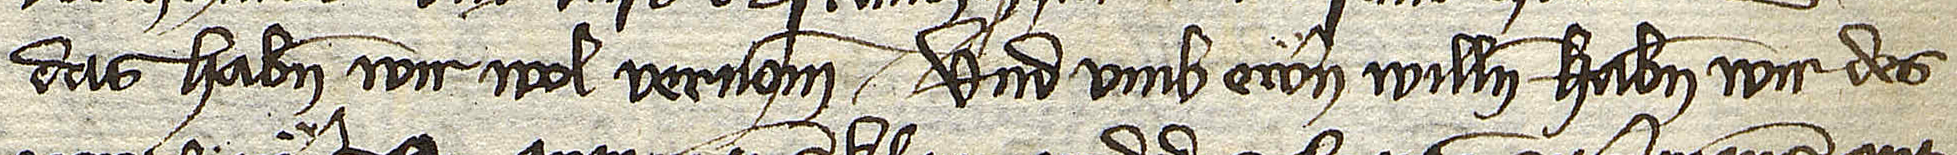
das habn* wir wol vernom* / Vnd vmb eẅ*n willn* habn* wir des
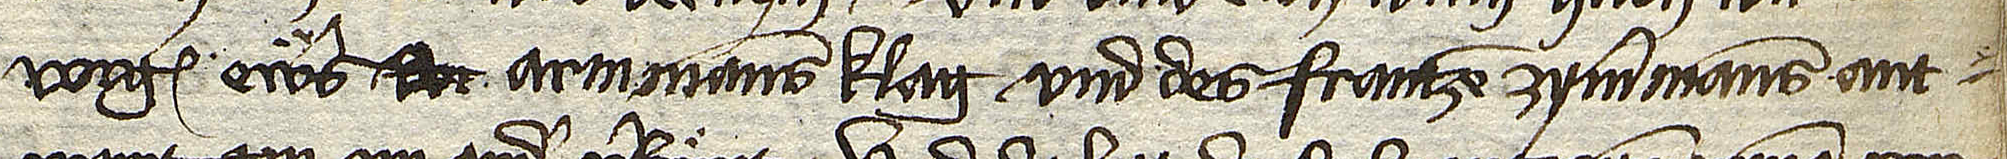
vorg* eẅ*s A armmans* klag / vnd des francʒe* ʒym*mans* ant =
